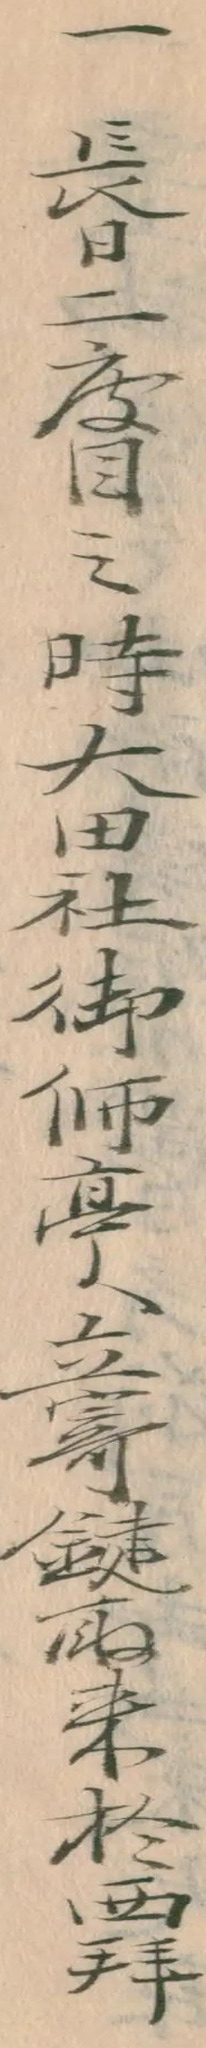一長日二度目之時大田社御師亭へ立寄鍵取来於西拝
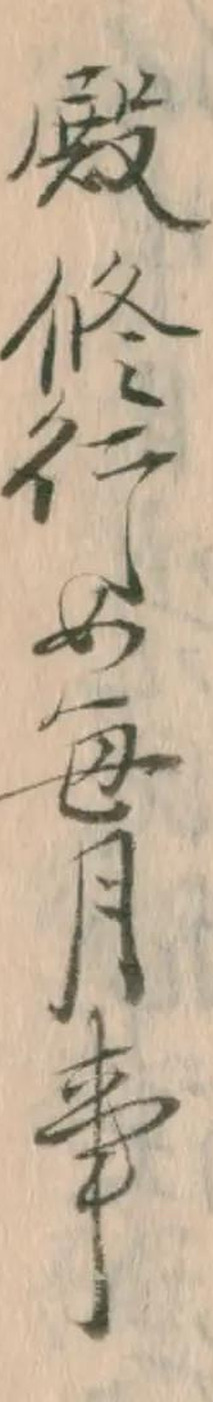殿修行如毎月事
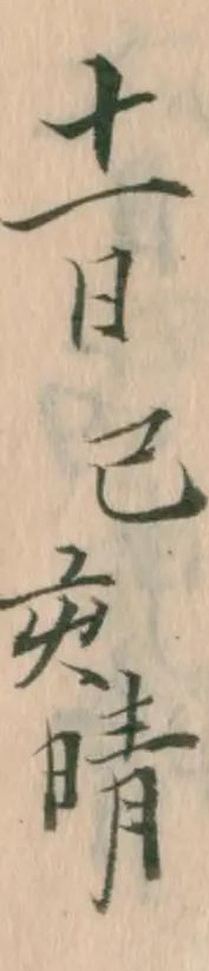十一日己亥晴
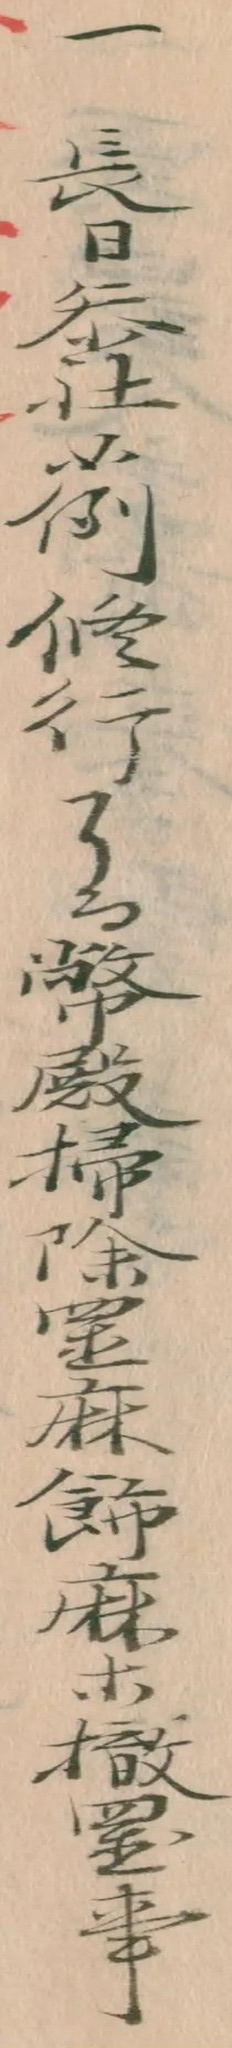一長日参社如例修行了而幣殿掃除置麻飾麻等撒置事
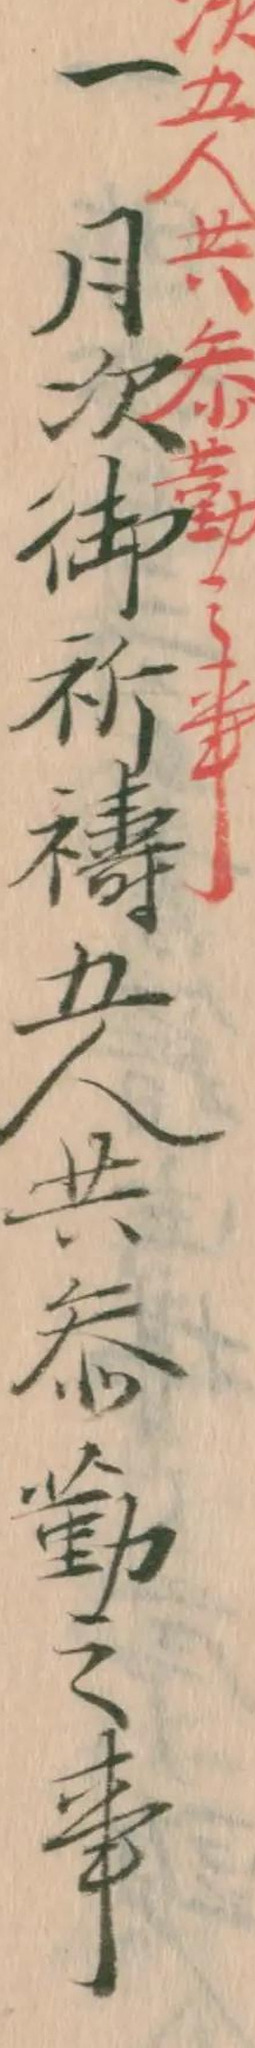一月次御祈祷五人共参勤之事
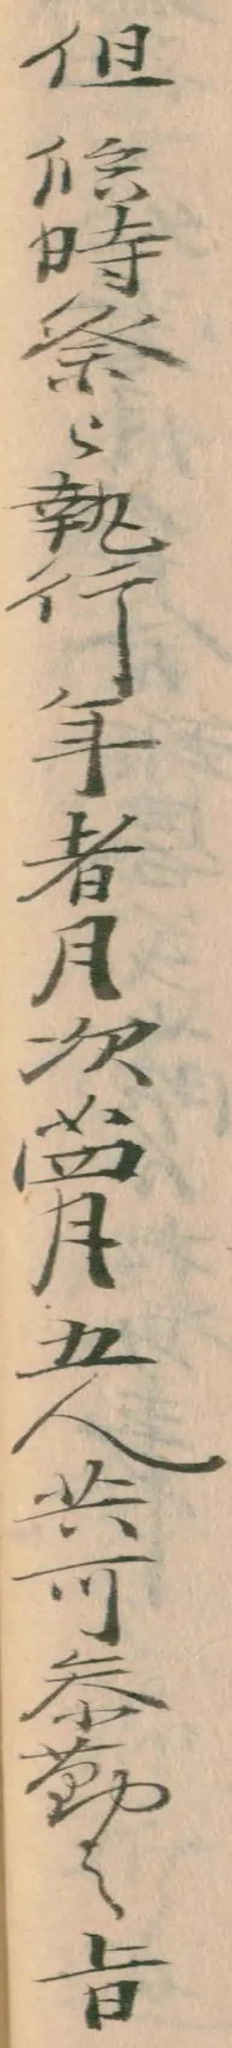但臨時祭被執行年者月次如四月五人共可参勤之旨
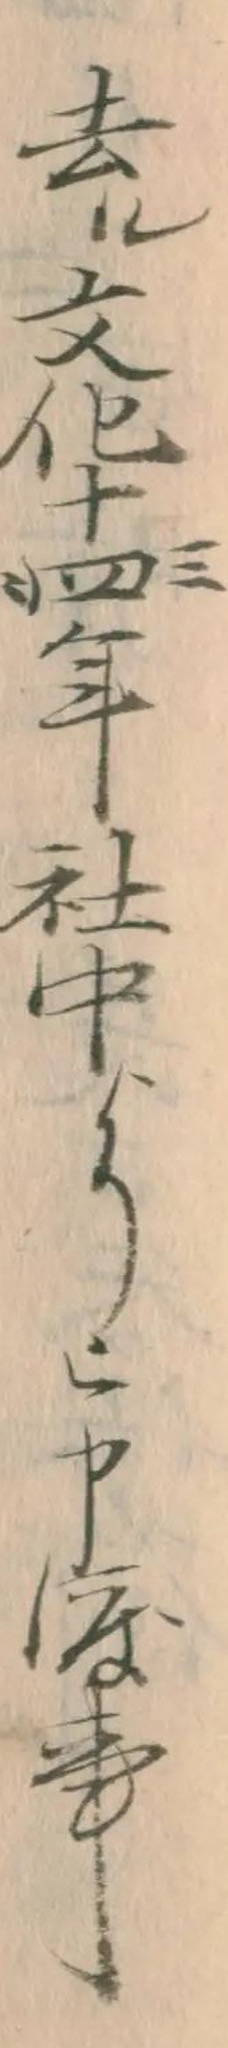去ル文化十三年社中より被申渡事
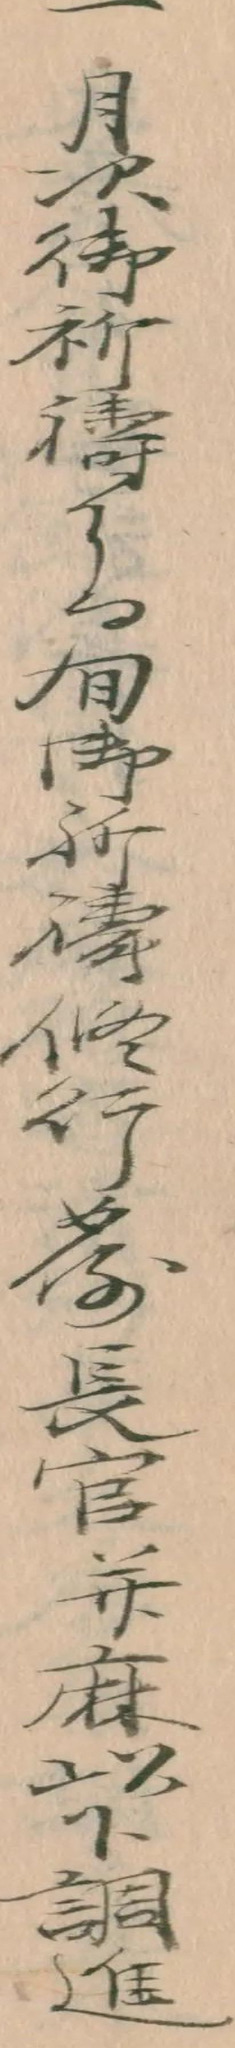一月次御祈禱了而旬御祈祷修行如例長官并麻以下調進
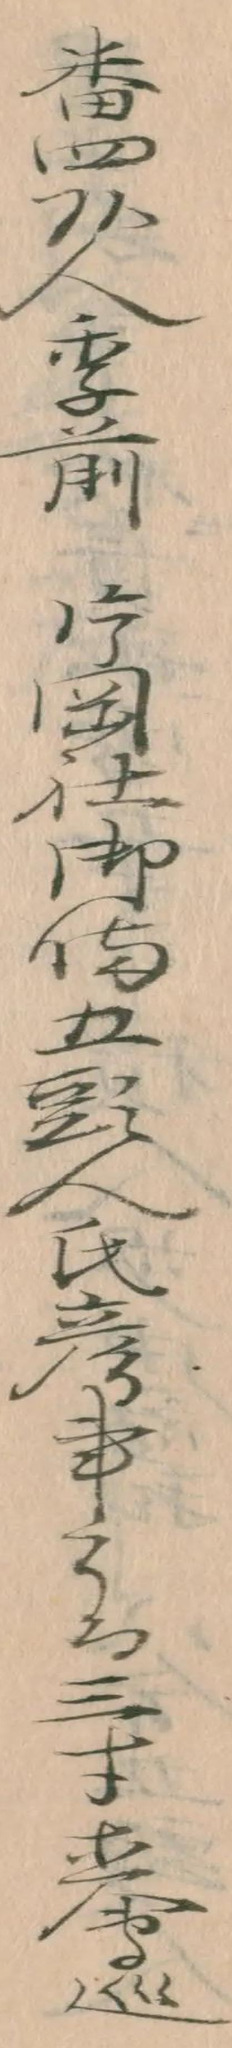番四頭人季前片岡社御備五頭人氏彦事了而三寸等直會巡
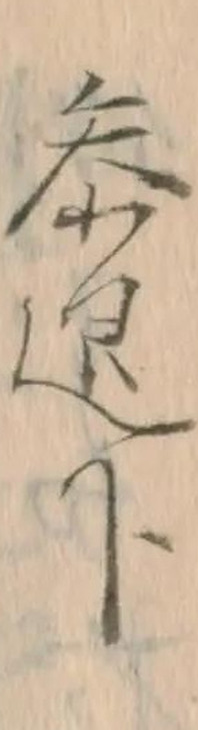参退下
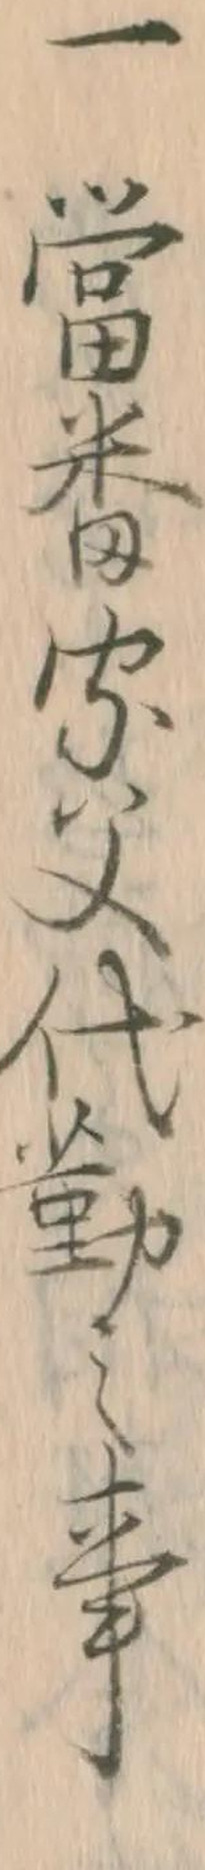一當番家父代勤之事
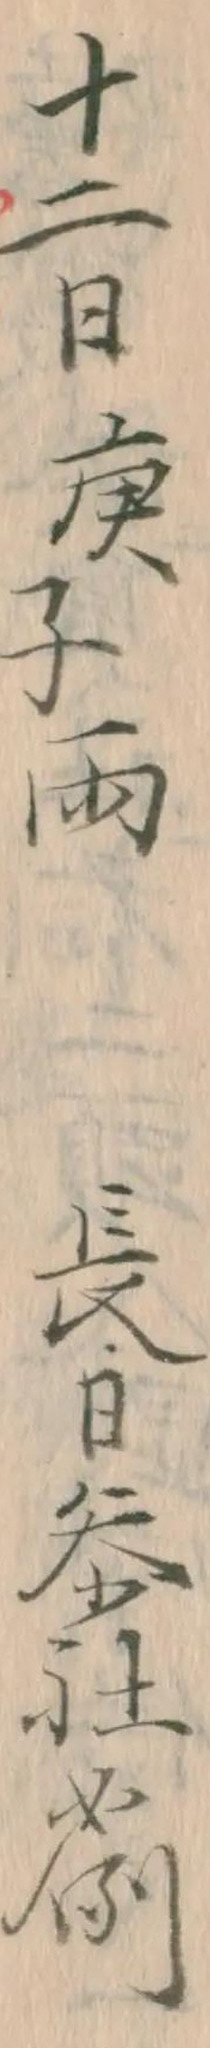十二日庚子雨長日参社如例
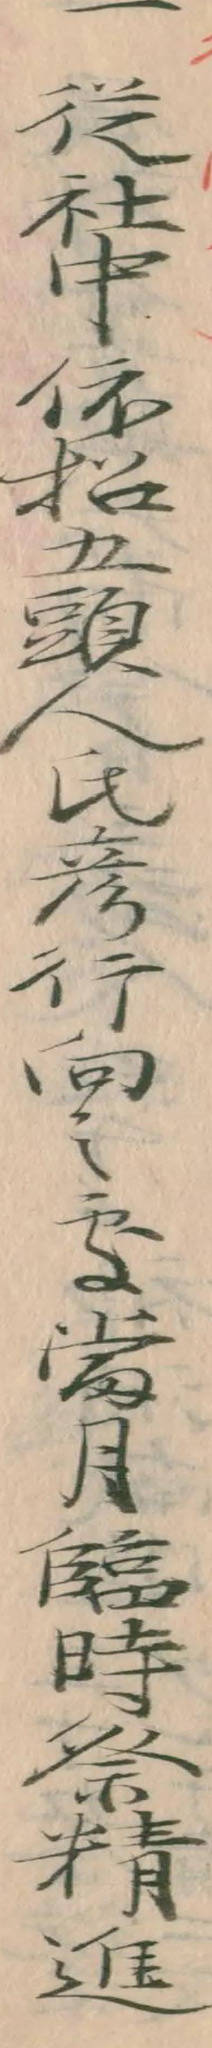一従社中依招五頭人氏彦行向之處當月臨時祭精進
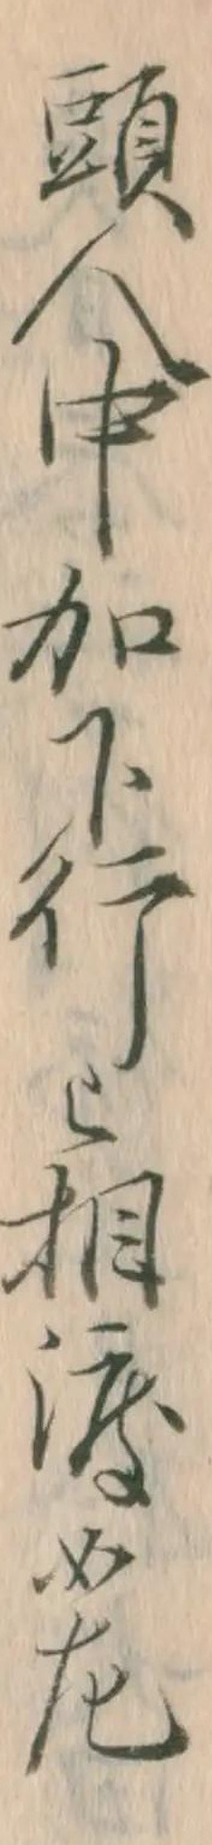頭人中加下行被相渡如左
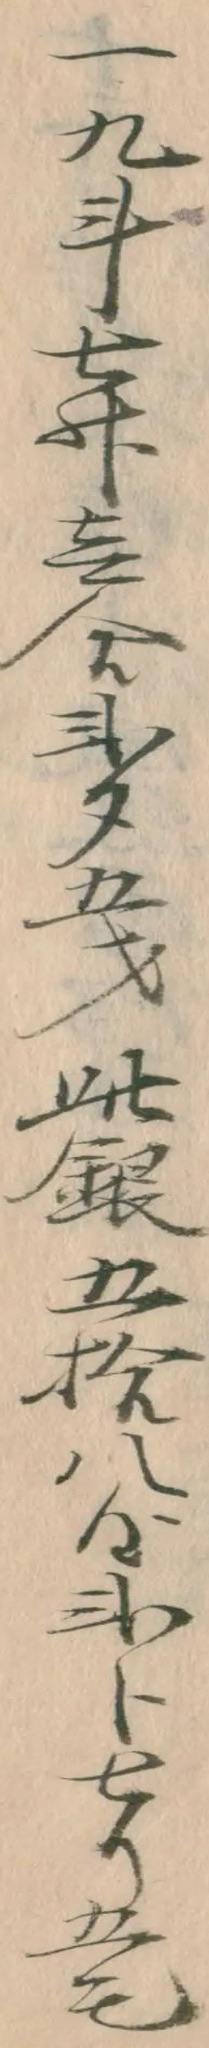一九斗七升壱合弐勺五才此銀五拾八匁弐分七り五毛
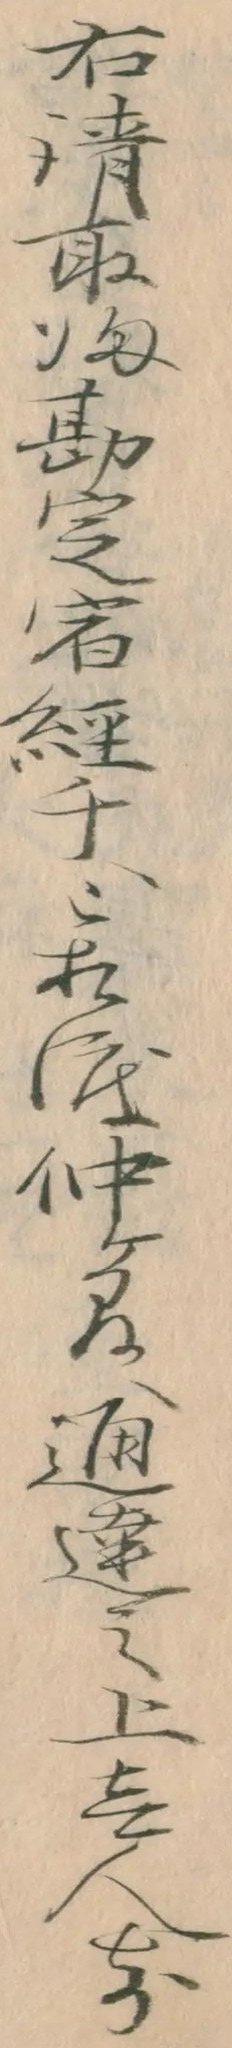右請取帰勘定宿経千へ被相渡仲ケ間へ通達之上壱人前
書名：賀茂社記録. 第74冊
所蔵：国立国会図書館 National Diet Library, JAPAN
